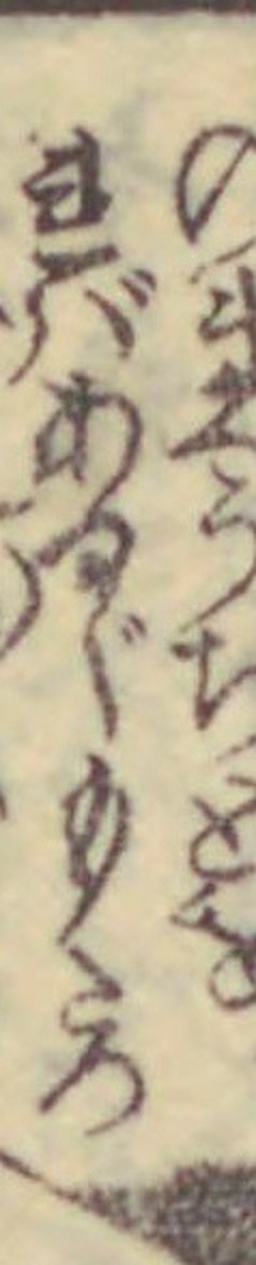れはあるじもくろ
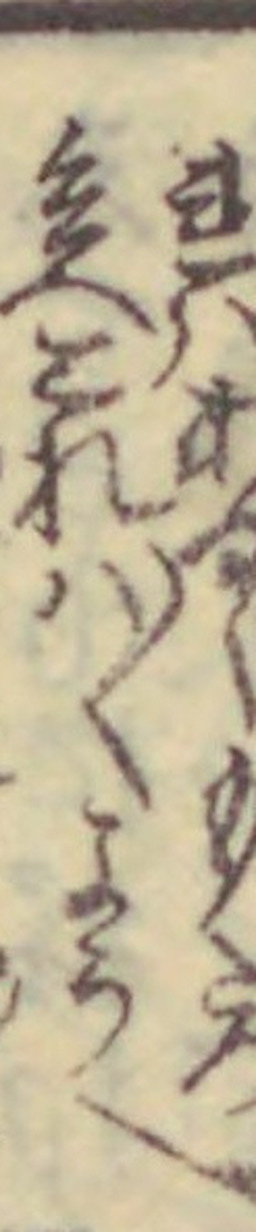兵へこれは〳〵よう
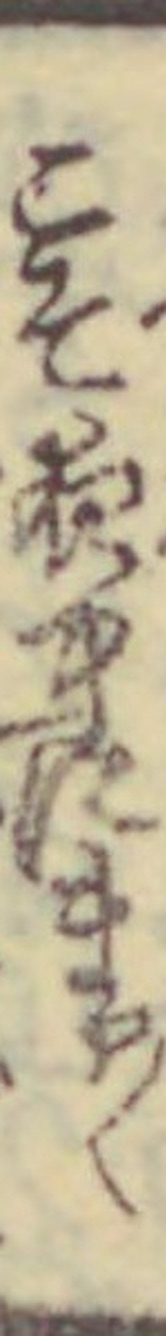こそ夜中にまア〳〵
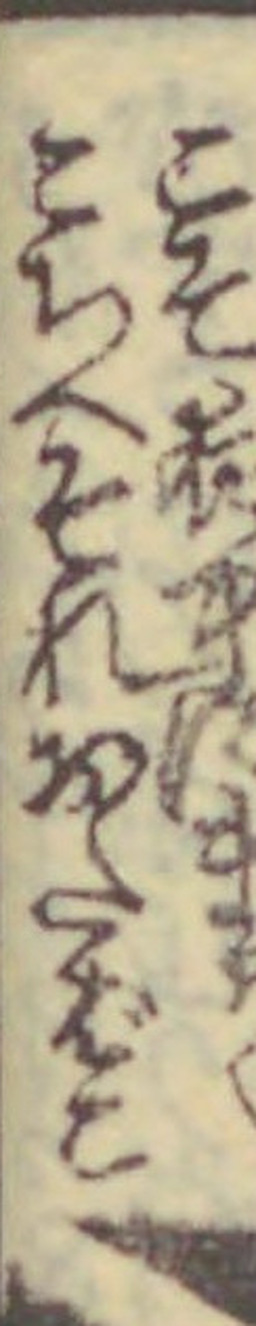こちらへそれおたばこ
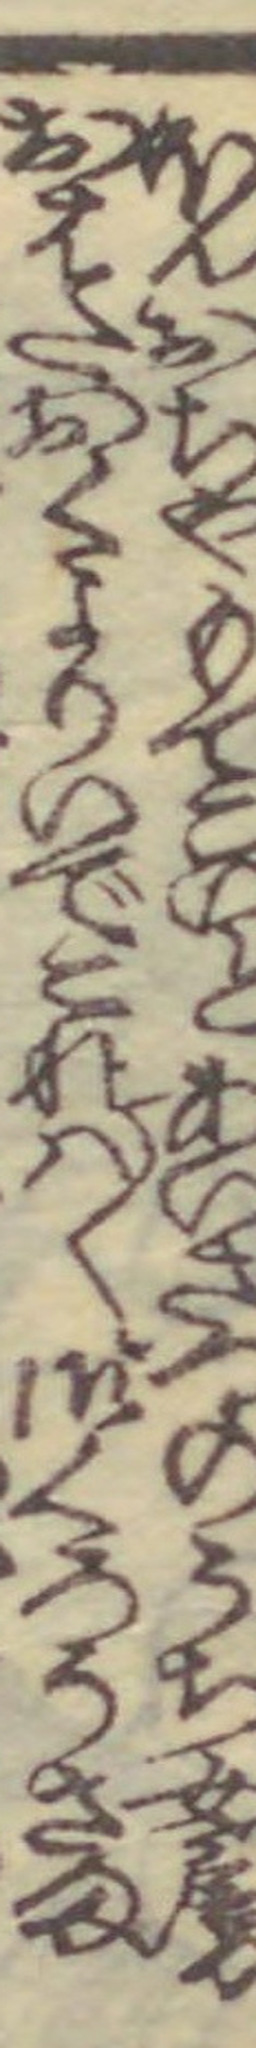おはたおくよりいでこれは〳〵御くろうさま
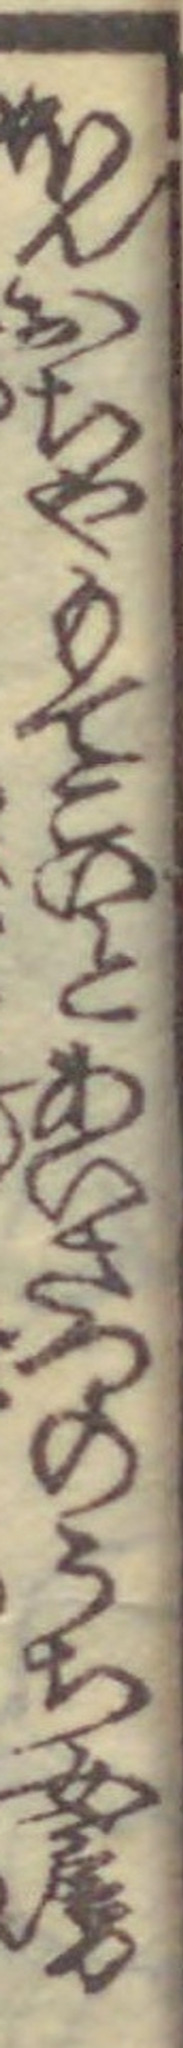ほんおちやもてこいとあいさつのうち女房
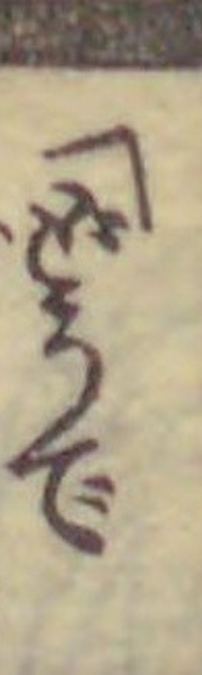〽どうで
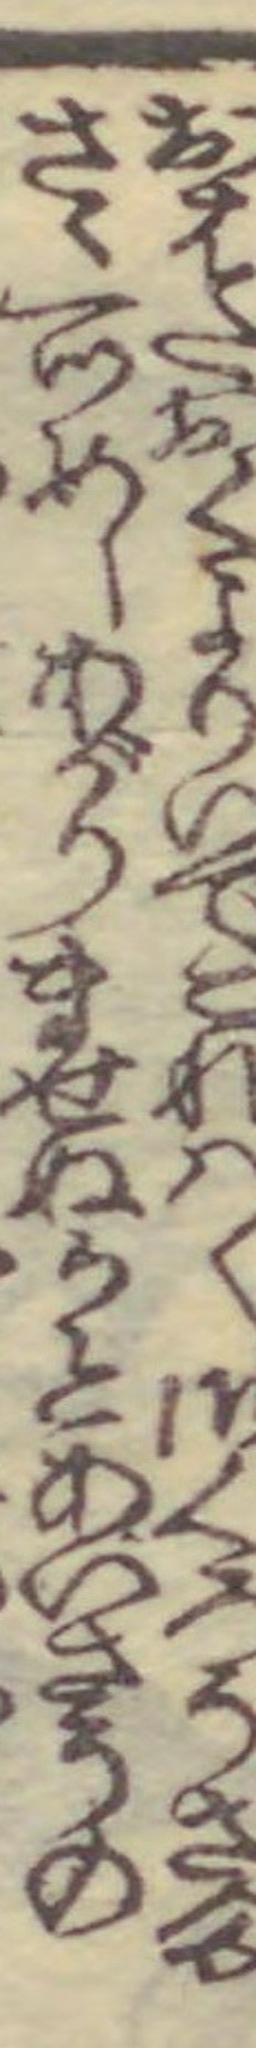さゝ一ッめしあがりませぬかとあいさうの
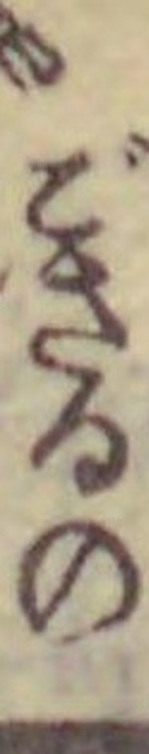ごさるの
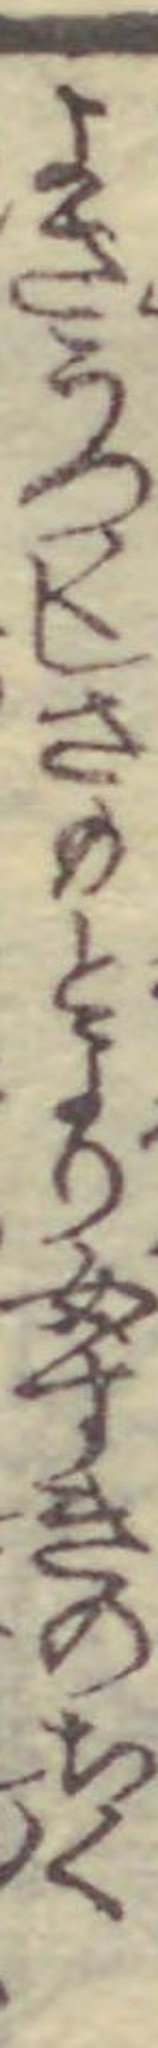よさうつくしさもとより女すきのちく
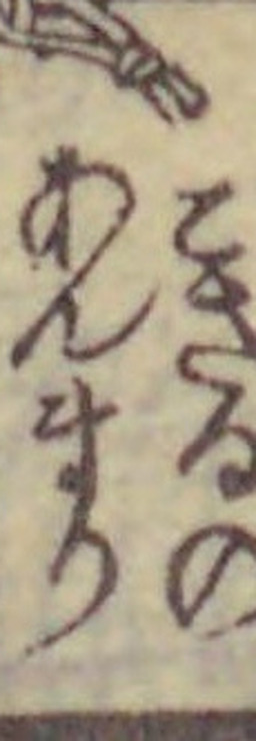あんまり
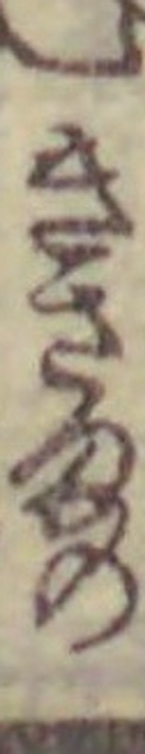きさまの
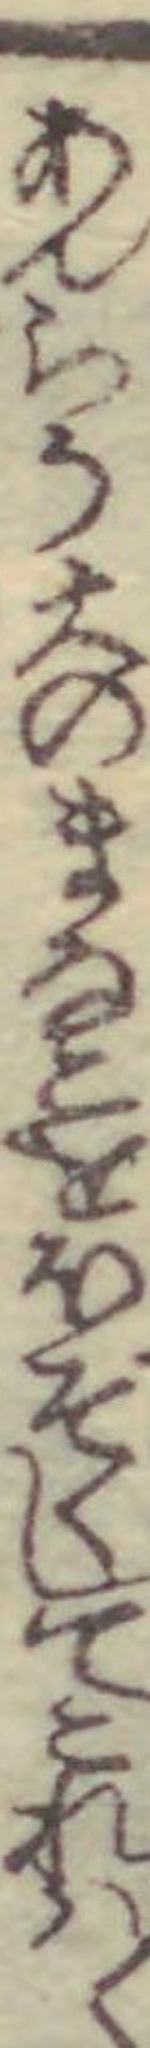あんらう大のまなこをほそくしてこれは〳〵
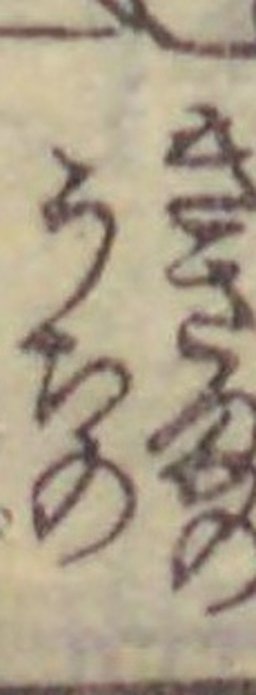うちの
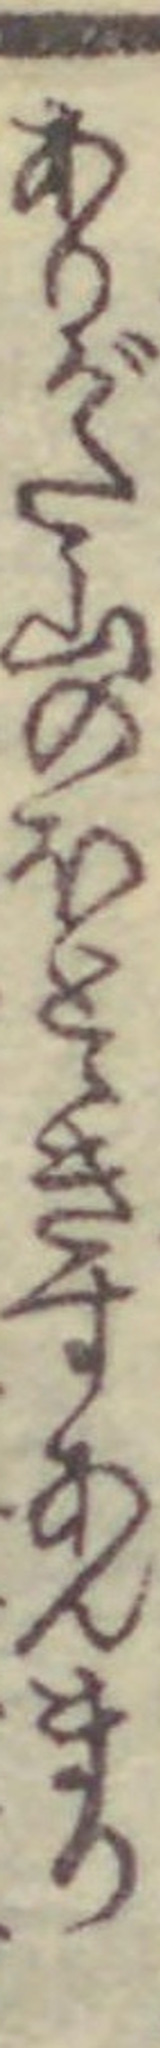ありがた山のほとゝきすあんまり
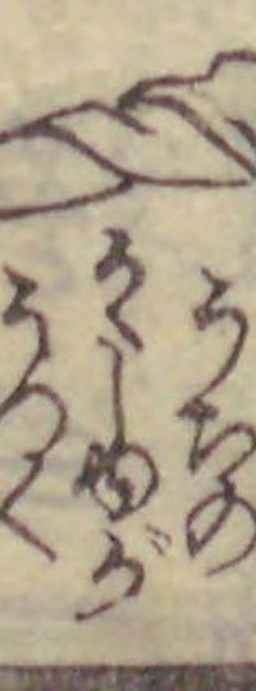かゝしゆが
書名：腹内窺機関 2巻
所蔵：国立国会図書館 National Diet Library, JAPAN
